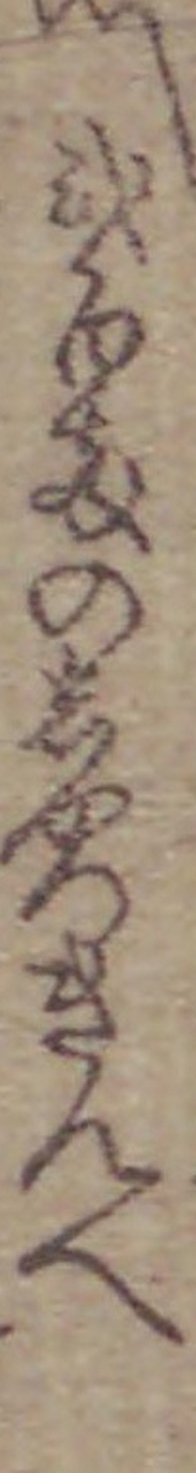〽弐百両のしやつきんへ
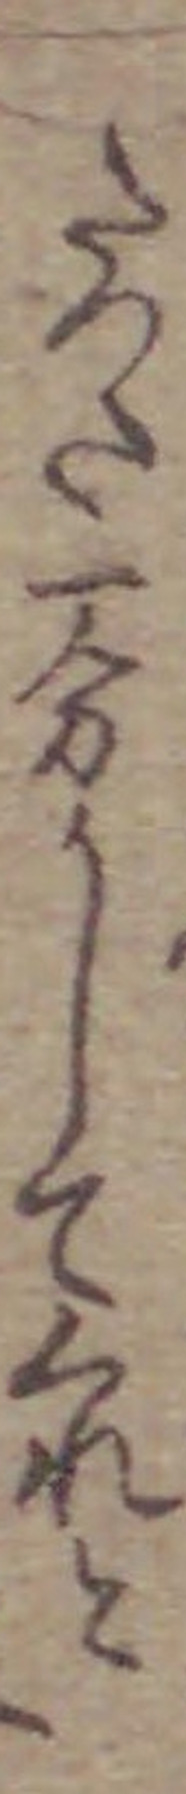たつた一分かしてくれと
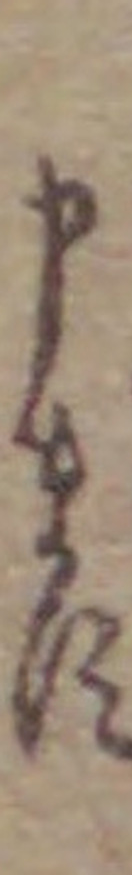申ます

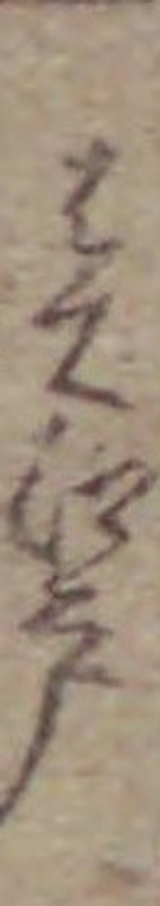はて江戸
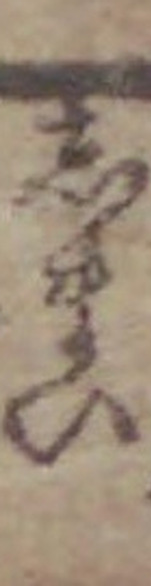しまい
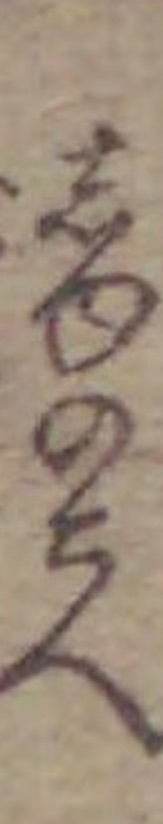しゆのこへ
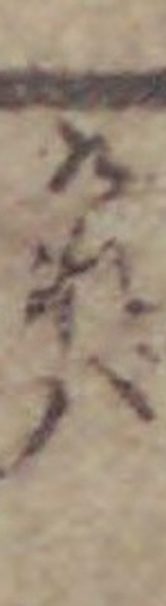ければ
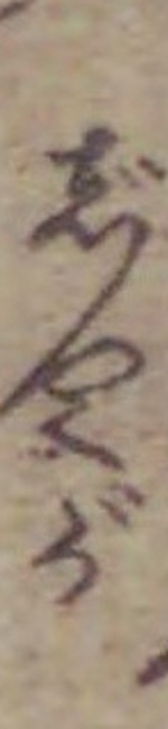じやが
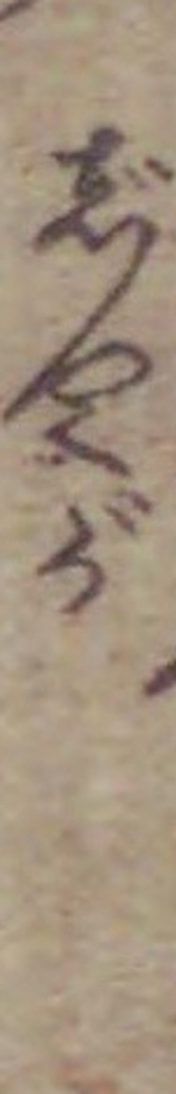じやが
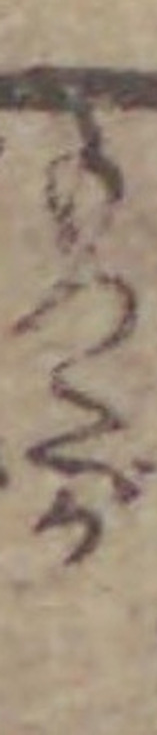もつたが
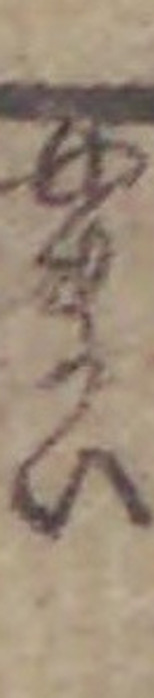やまい
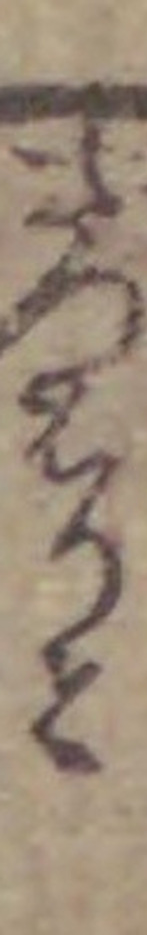さつはりと
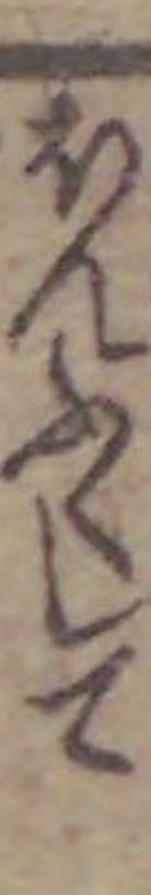ほんふくして
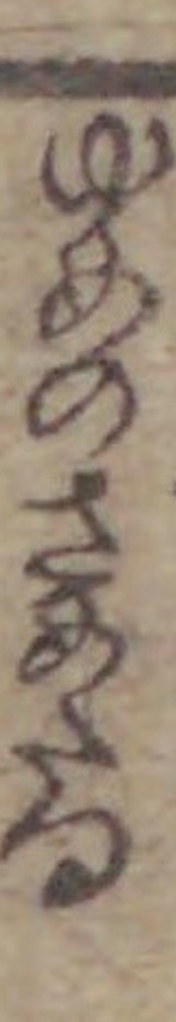ゆめのさめたる
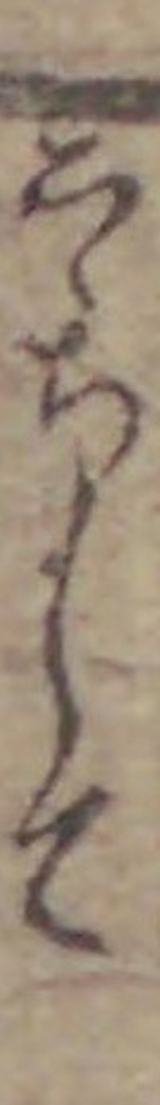こゝちして
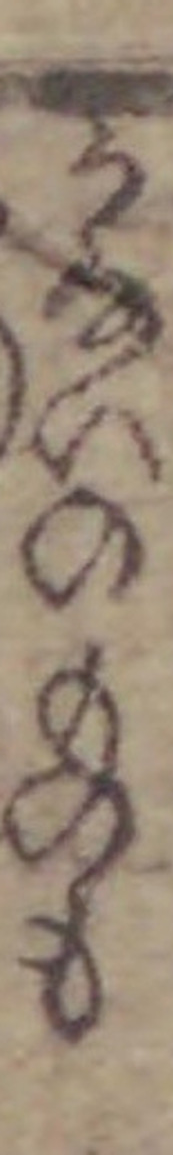かないのものも
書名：御代の御寶
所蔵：国立国会図書館 National Diet Library, JAPAN
